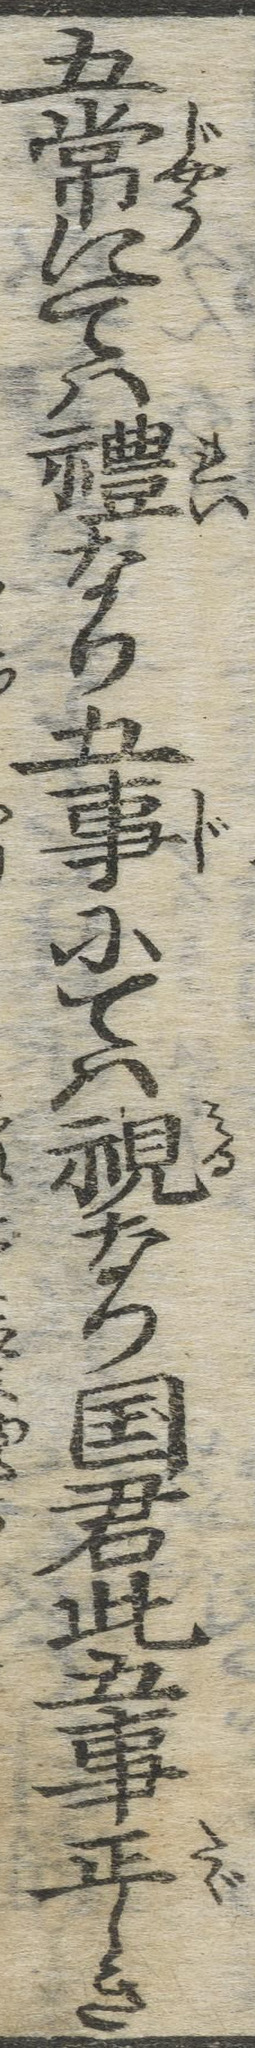五常にては禮なり五事にては視なり国君此五事正しき
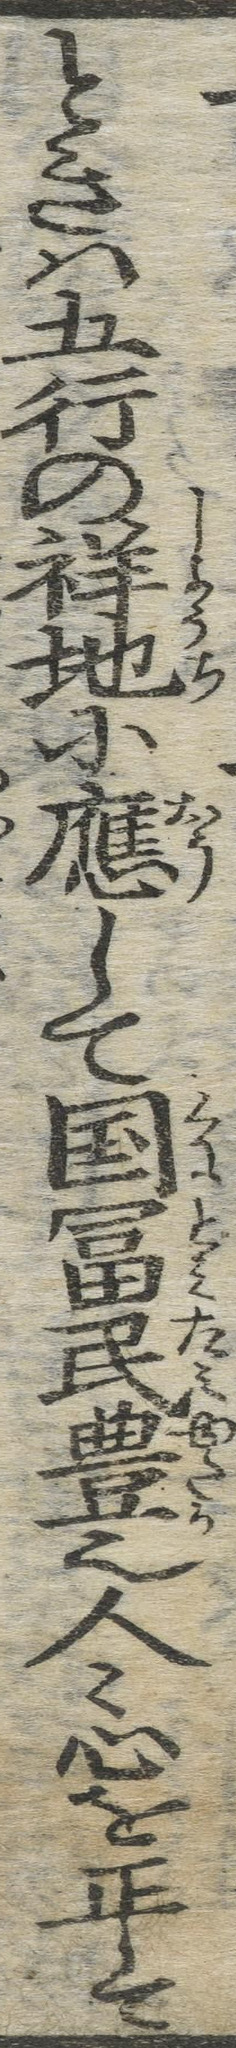ときは五行の祥地に應して国冨民豊也人〻心を正して
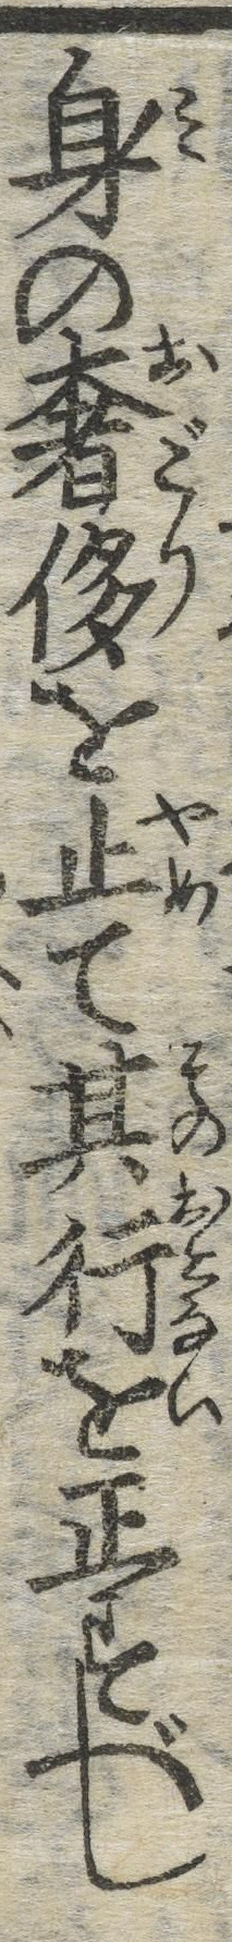身の奢侈を止て其行を正すべし
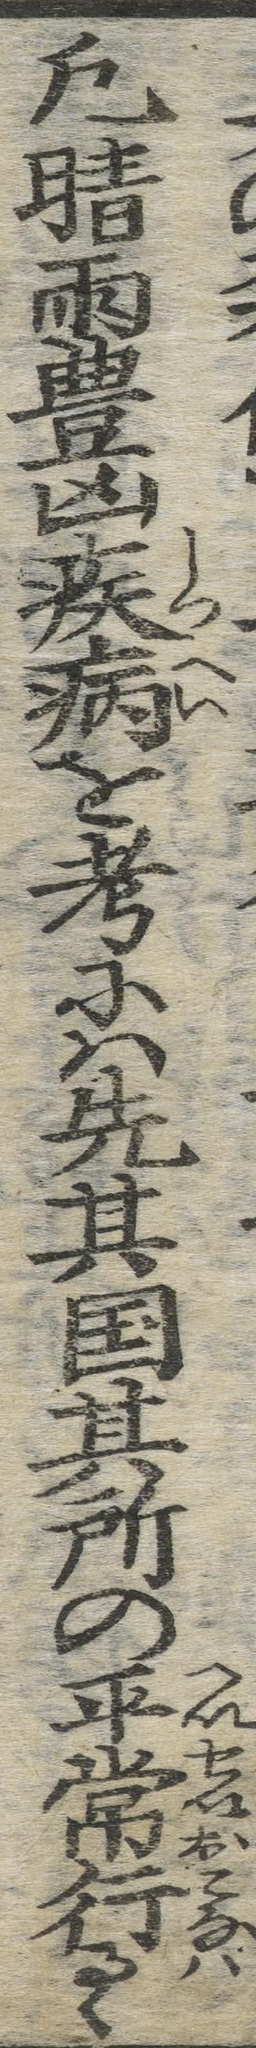凡晴雨豊凶疾病を考には先其国其所の平常行るゝ

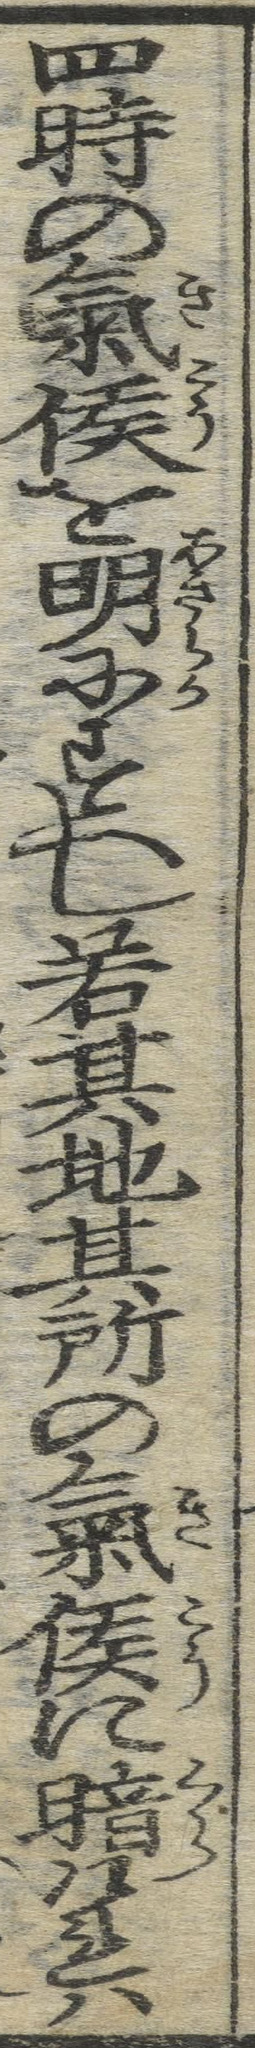四時の気候を明にすへし若其地其所の気候に暗けれは
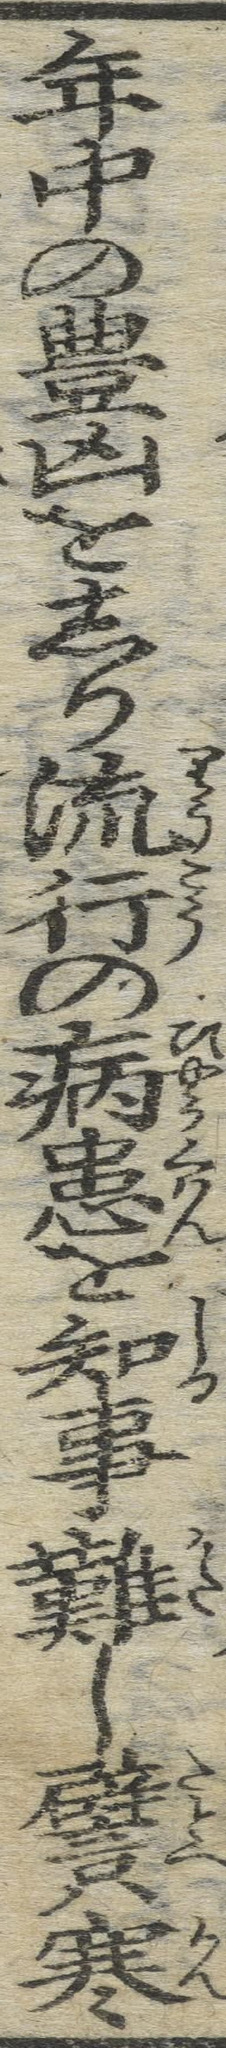年中の豊凶をしり流行の病患を知事難し譬は寒
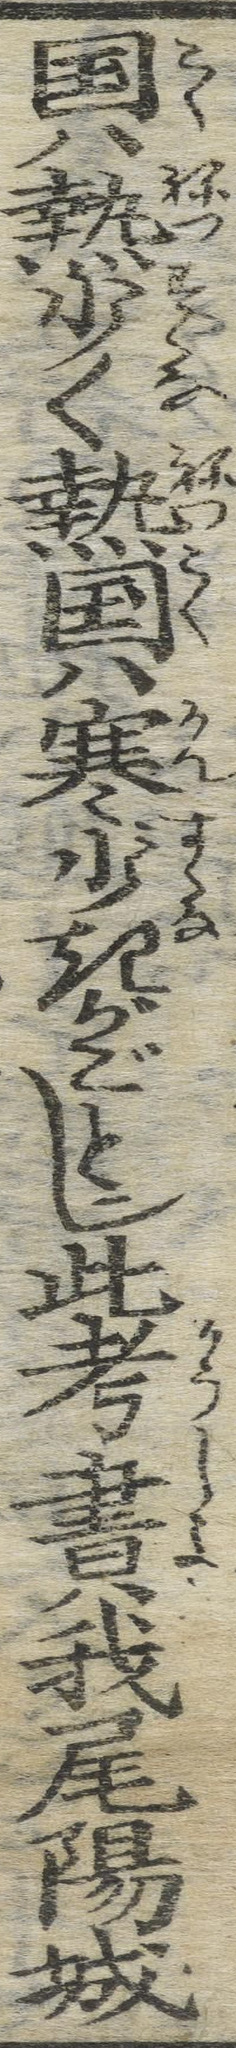国は熱少く熱国は寒少きがごとし此考書は我尾陽城
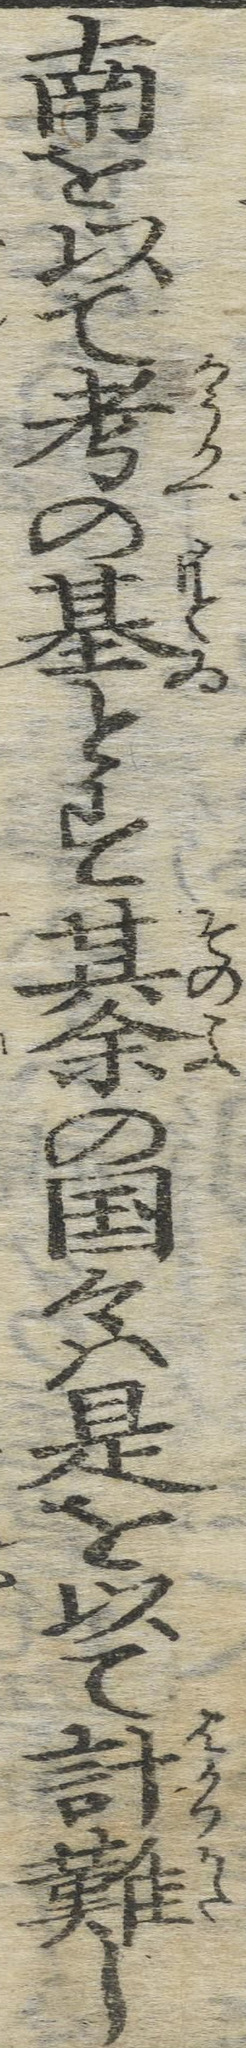南を以て考の基とす其余の国々は是を以て計難し
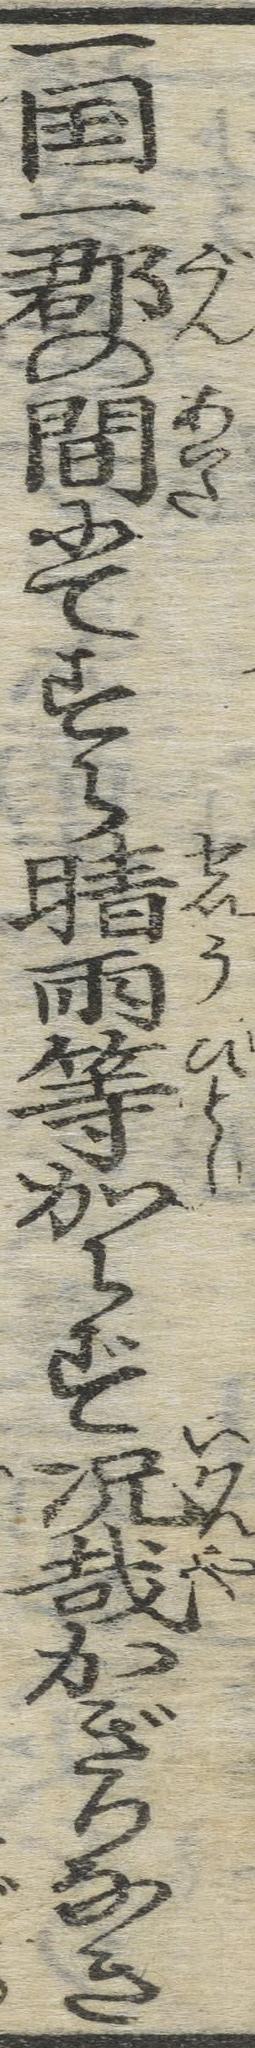一国一郡の間にてすら晴雨等からず况哉かぎりなき
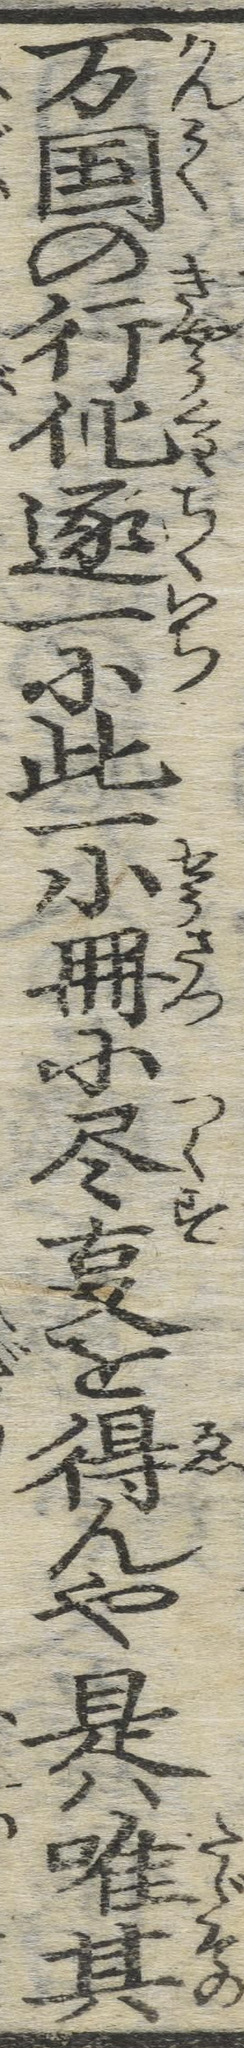万国の行化逐一に此一小冊に尽事を得んや是は唯其
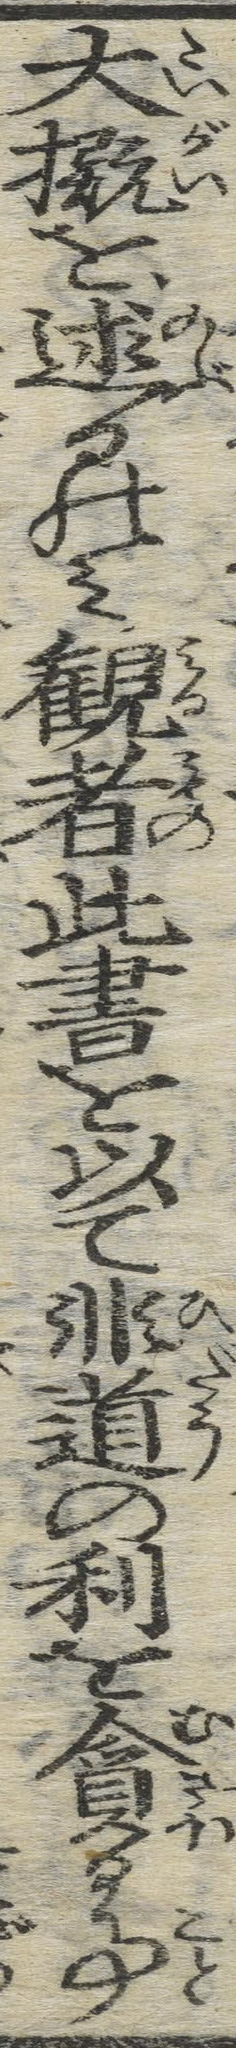大概を述るのみ観者此書を以て非道の利を貪る事
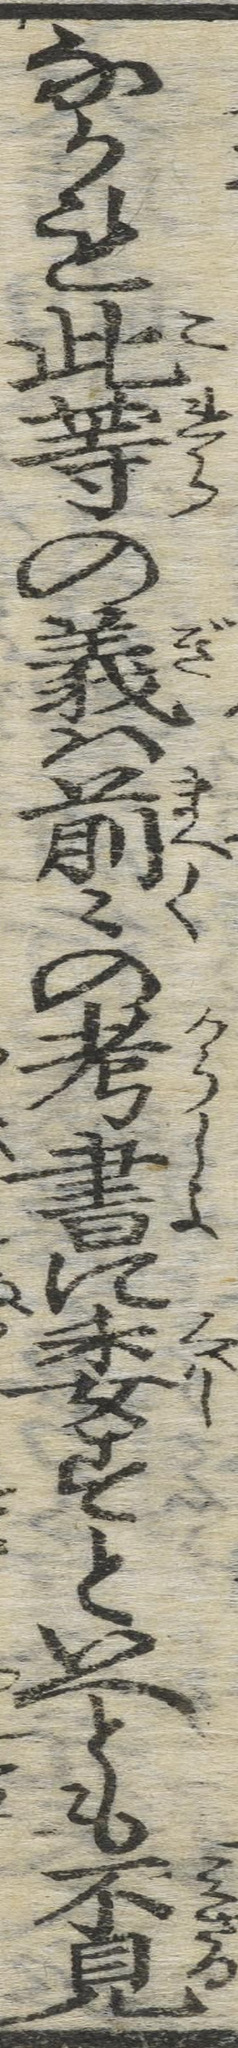なかれ此等の義は前〻の考書に委すといへとも不見
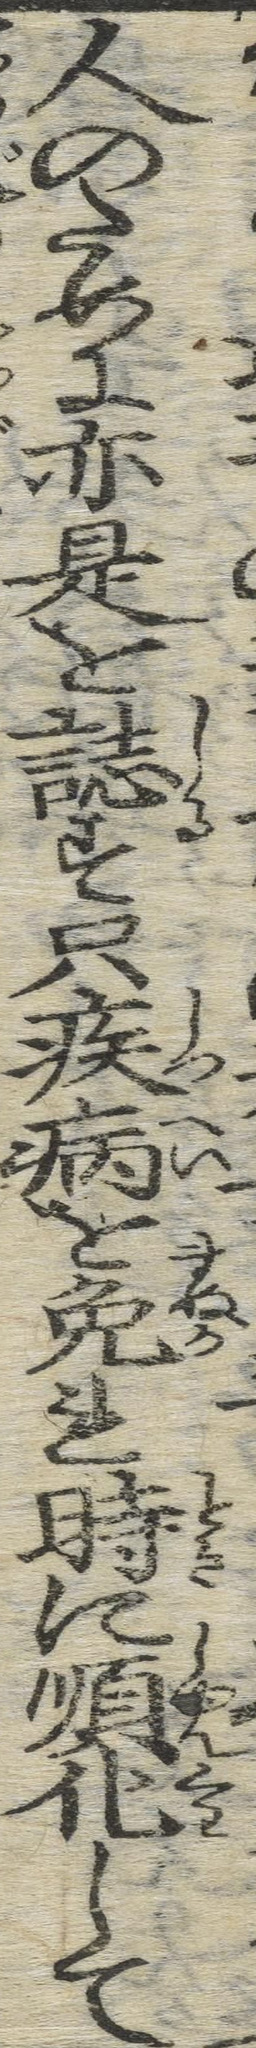人のために亦是を誌す只疾病を免れ時に順化して
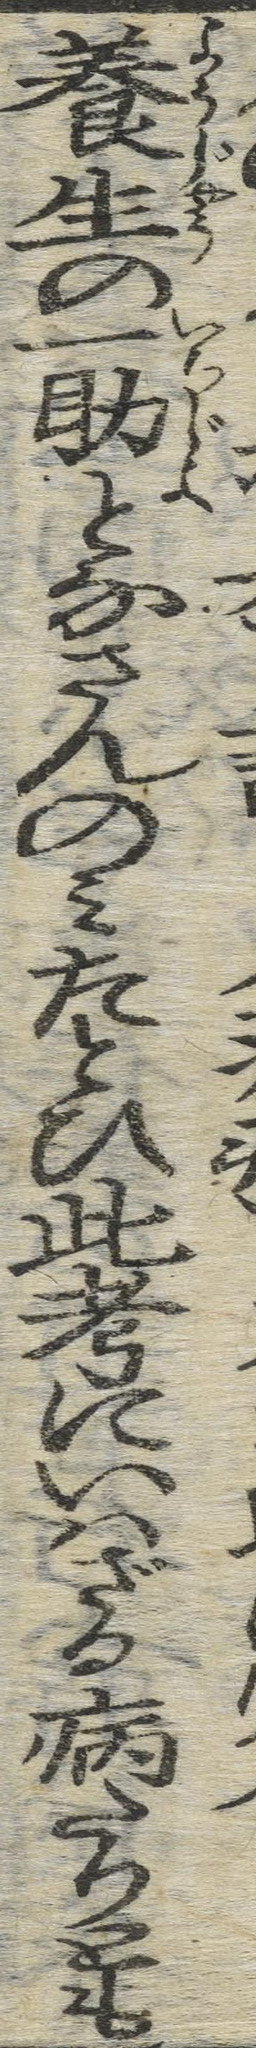養生の一助となさんのみたとひ此考にいはざる病たりとも
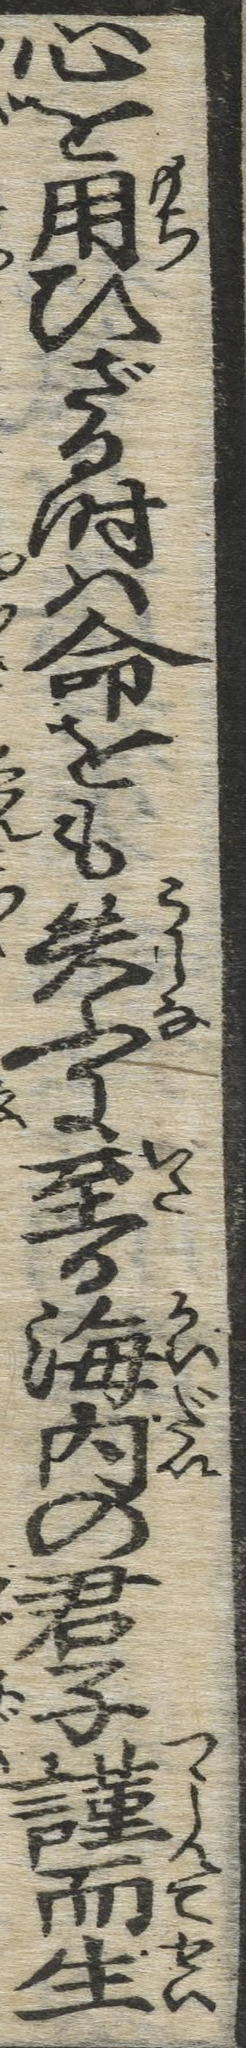心を用ひざる時は命をも失ふに至る海内の君子謹而生
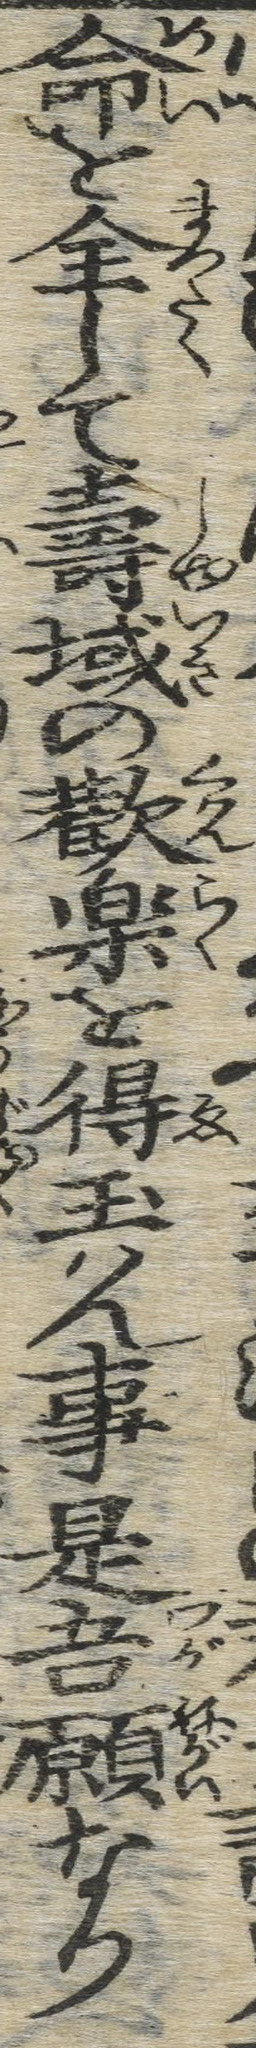命を全して壽域の歓楽を得玉はん事是吾願なり
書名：[晴雨考]
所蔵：東京大学地震研究所図書室 Earthquake Research Institute Library, The University of Tokyo, JAPAN
